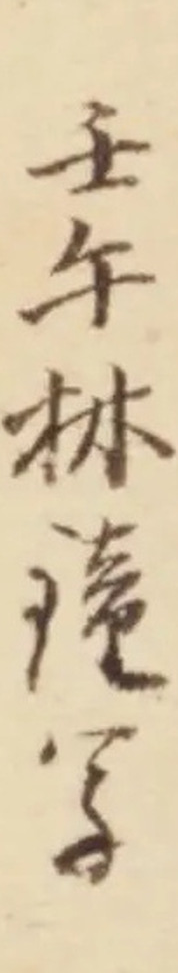壬午林鐘写
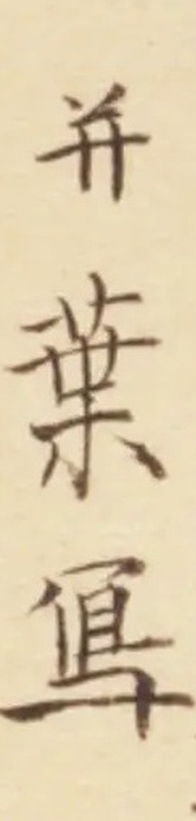并葉寫
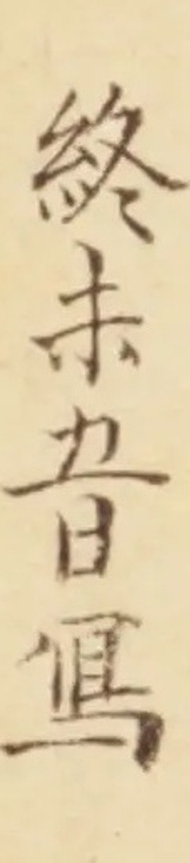終未五日寫
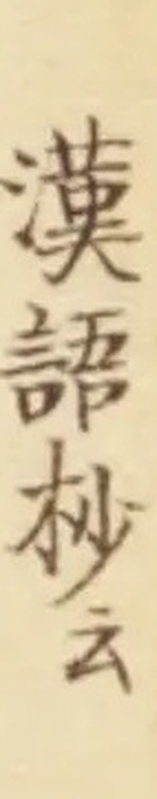漢語抄云
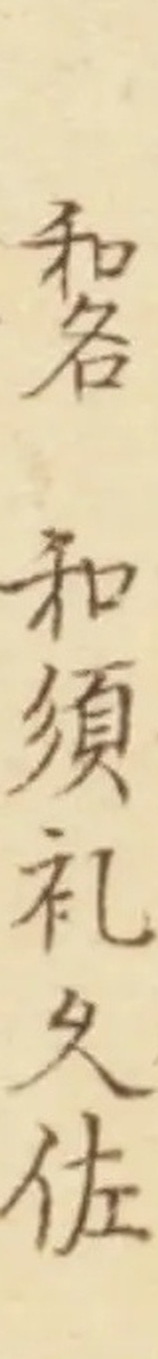和名和須礼久佐
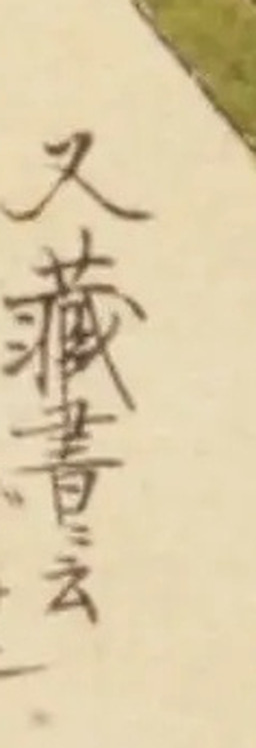又蔵書に云
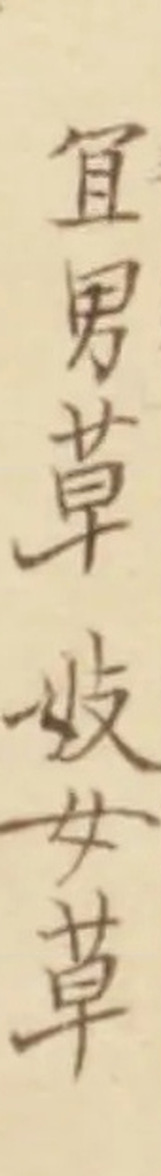冝男草妓女草
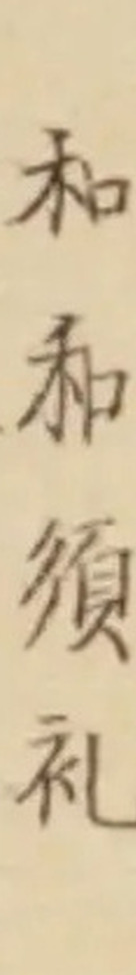和和須礼
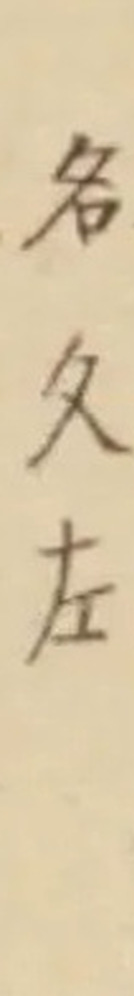名久左

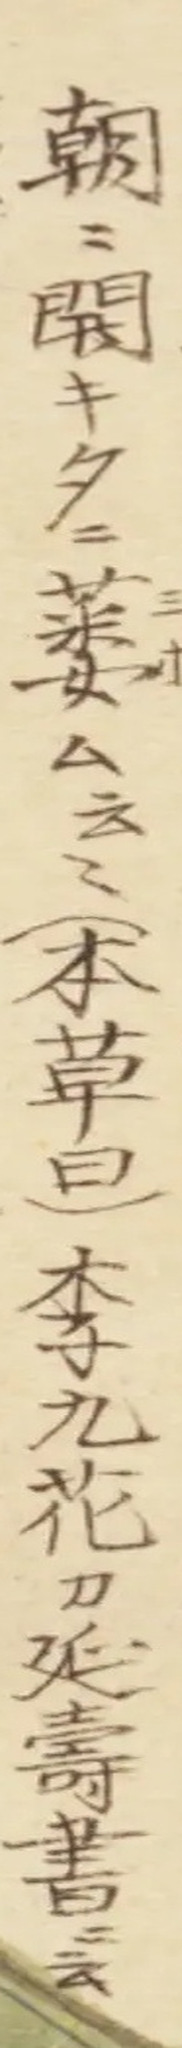朝に開き夕に萎む云々(本草曰)李九花か延壽書に云

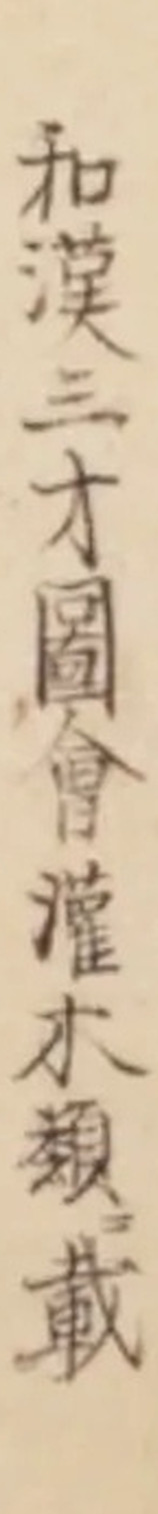和漢三才圖會灌木類に曰
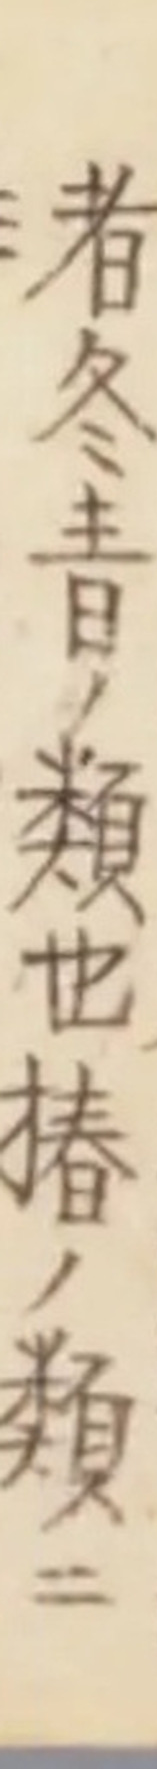者冬青の類也椿の類に
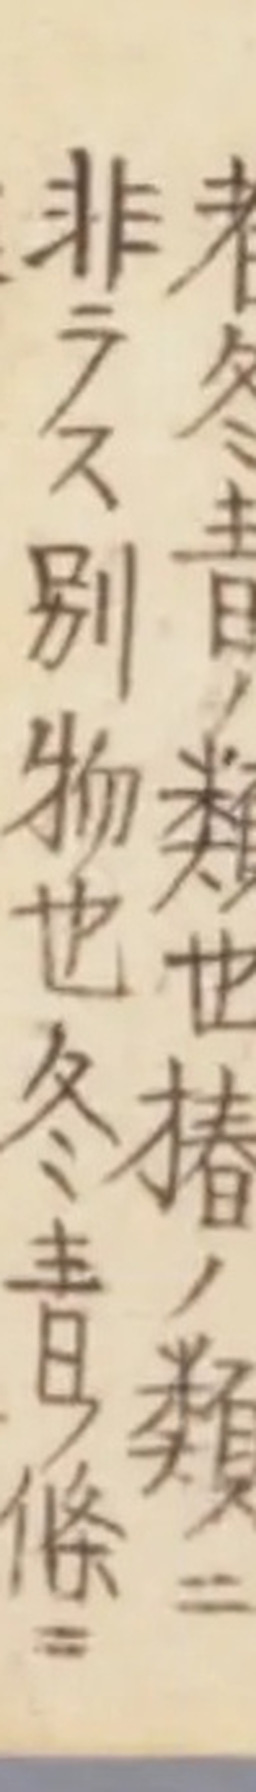非らす別物也冬青の條に
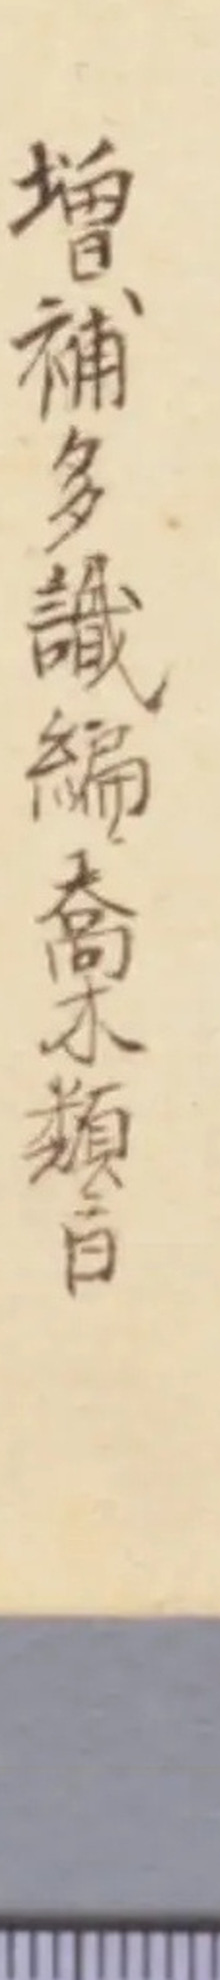増補多識編喬木類に曰
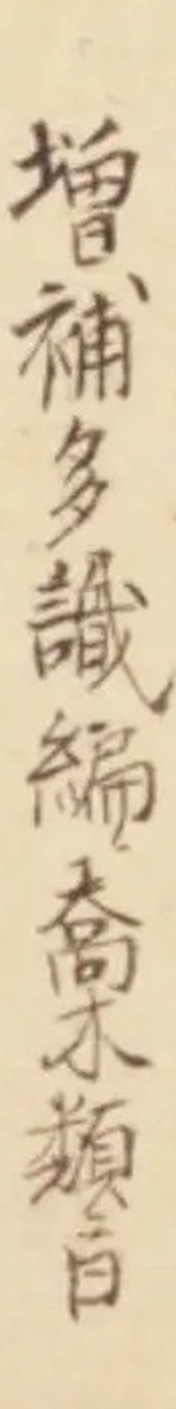増補多識編喬木類に曰
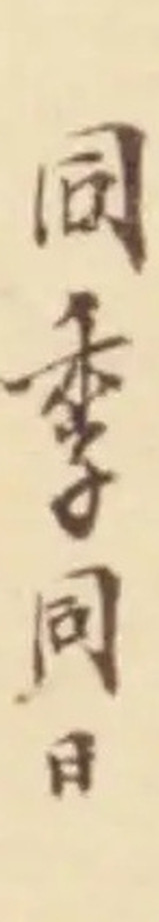同季同日
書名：梅園草木花譜夏之部. 1
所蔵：国立国会図書館 National Diet Library, JAPAN
